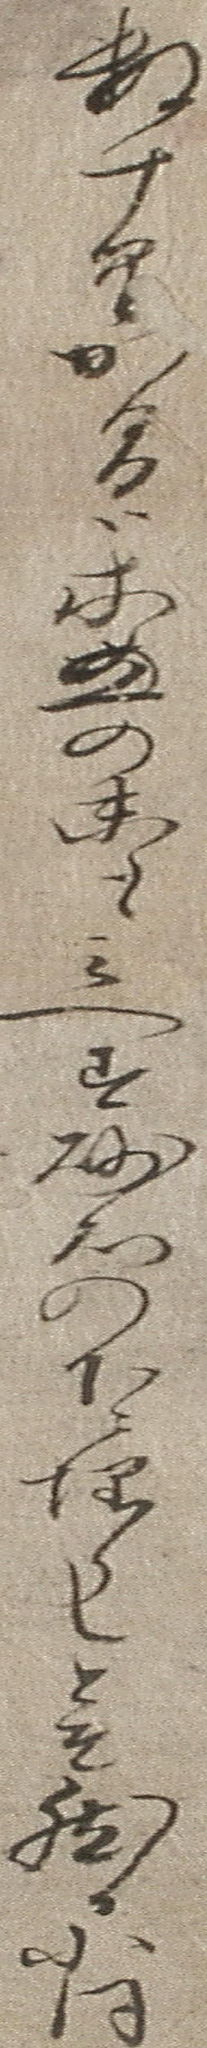数十里か間は木立の末もみへす砂石の下に埋りしとそ然るに同
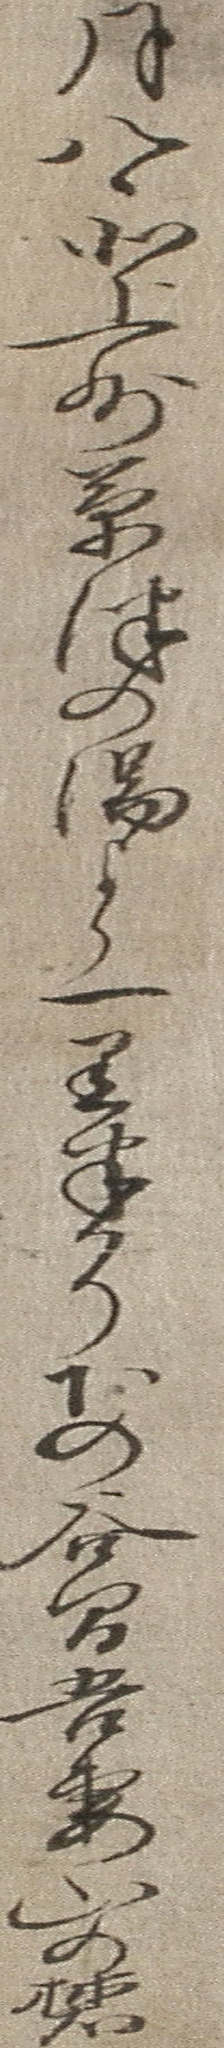月八日北上州草津の湯より一里半より下の谷間吾妻山の梺
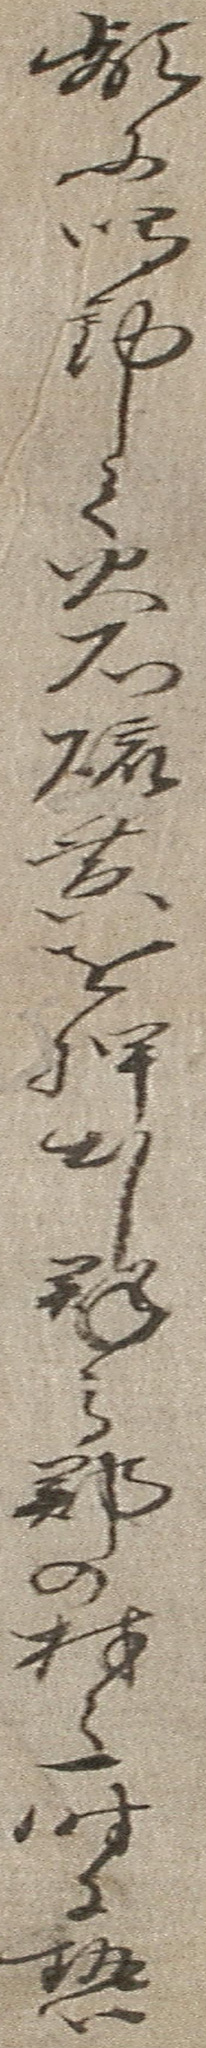頻に鳴動して火石硫黄を押出し群馬郡の村々一時に熱
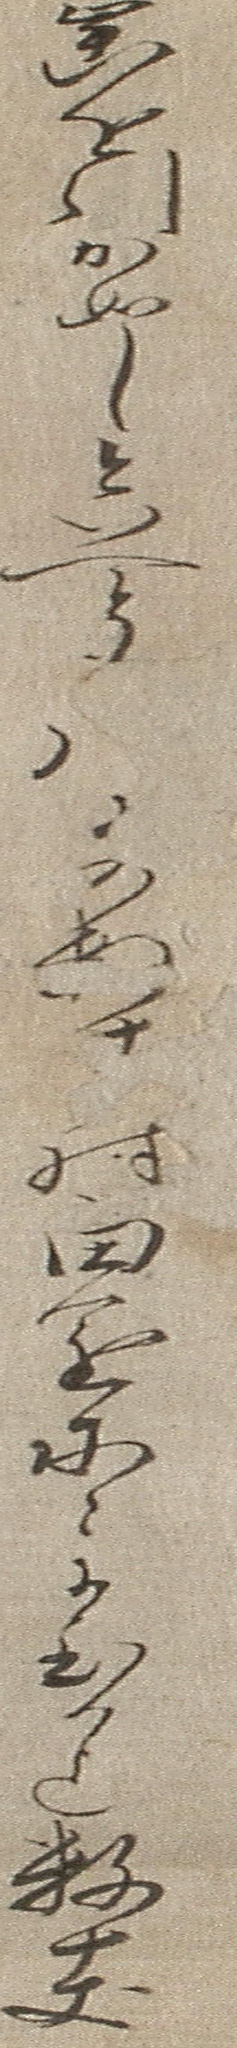墨を引か如しといへとも？村田懸所々に至る迄数十丈
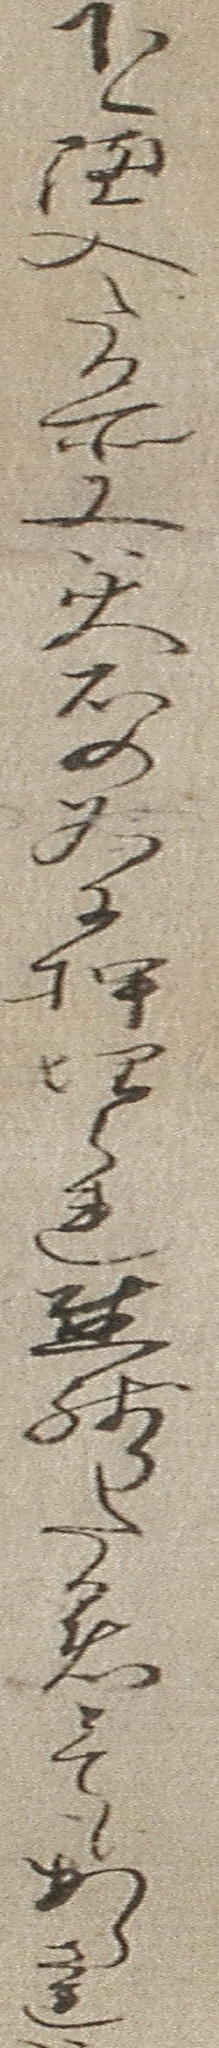下へ堕入りたる所又は火石の為に押埋られ生残りたる者とてもあらされは
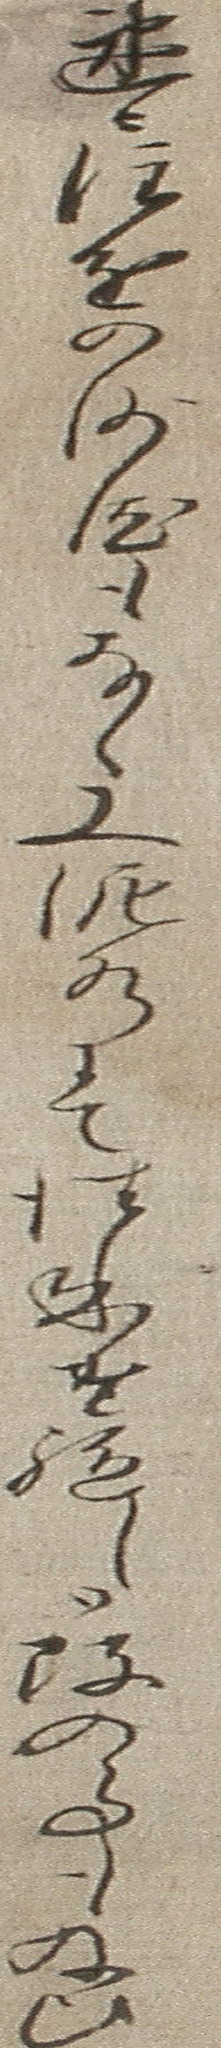速に注進の沙汰もなく又泥水にて往来を絶し御改の事も及び
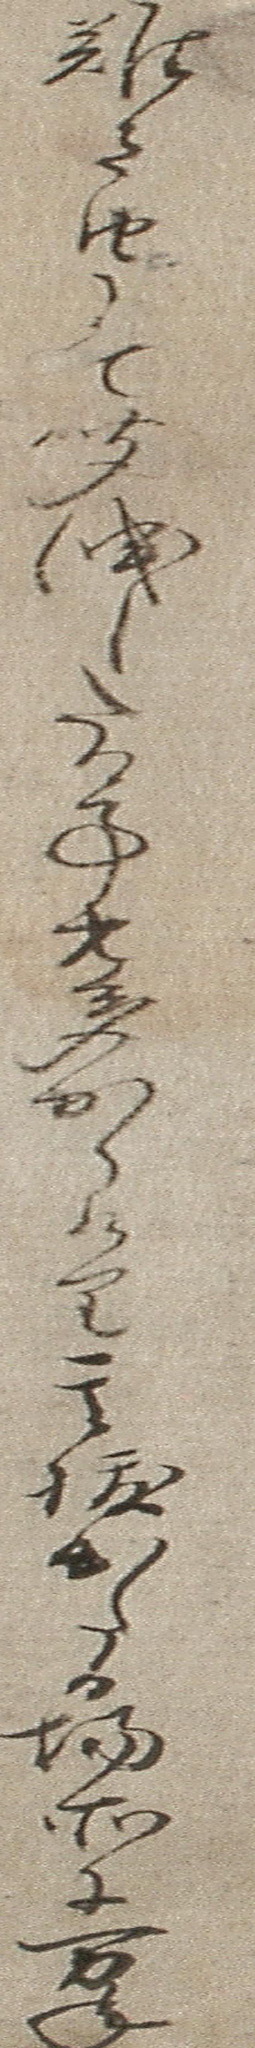難き由にて聞漏したる事共多かりけり其抜出たる場所に万年
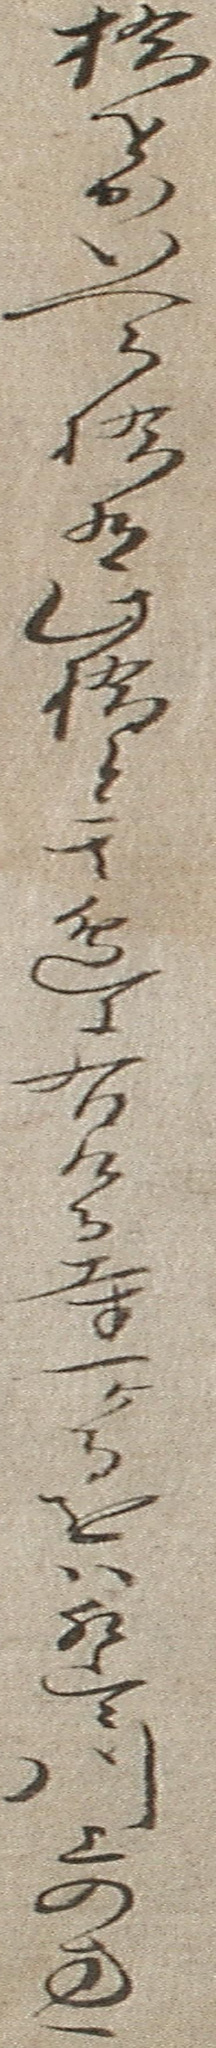橋をかいへら橋有候此橋と其辺に有ける寺一ヶ寺をは追々川上の方へ
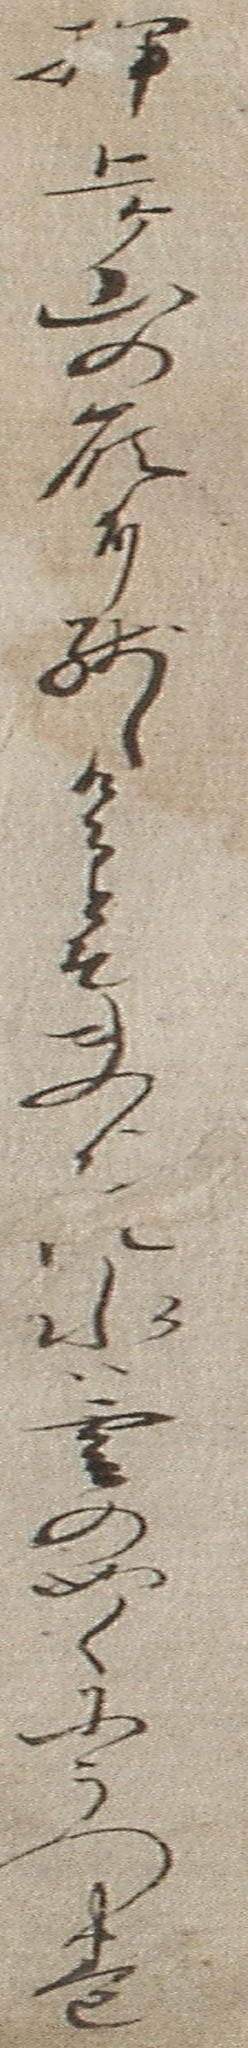押上ヶ山の頂に残しけるとそ夫ゟ泥水は雲の如くにうつ巻
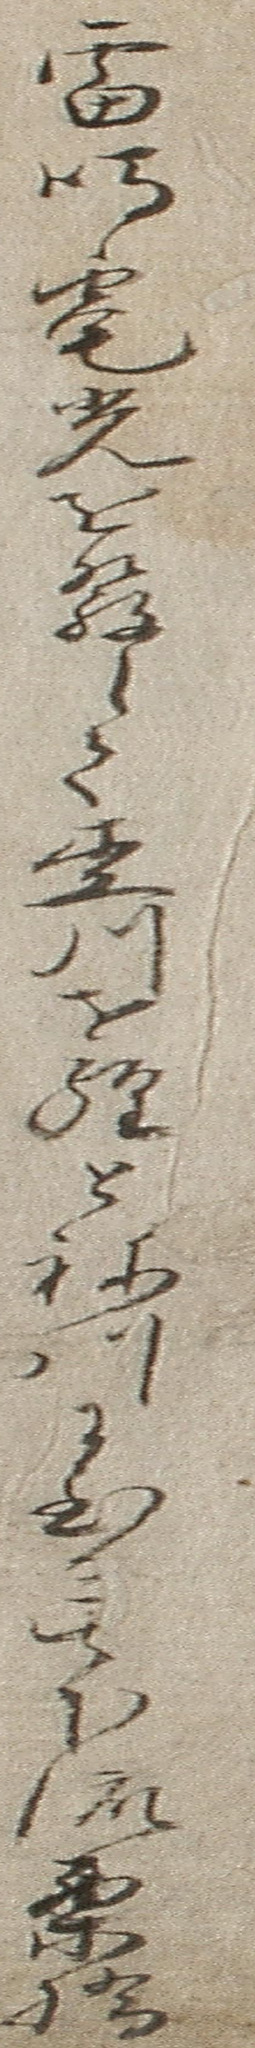雷鳴電光を発して杢川を経とね川に至り其下流栗橋
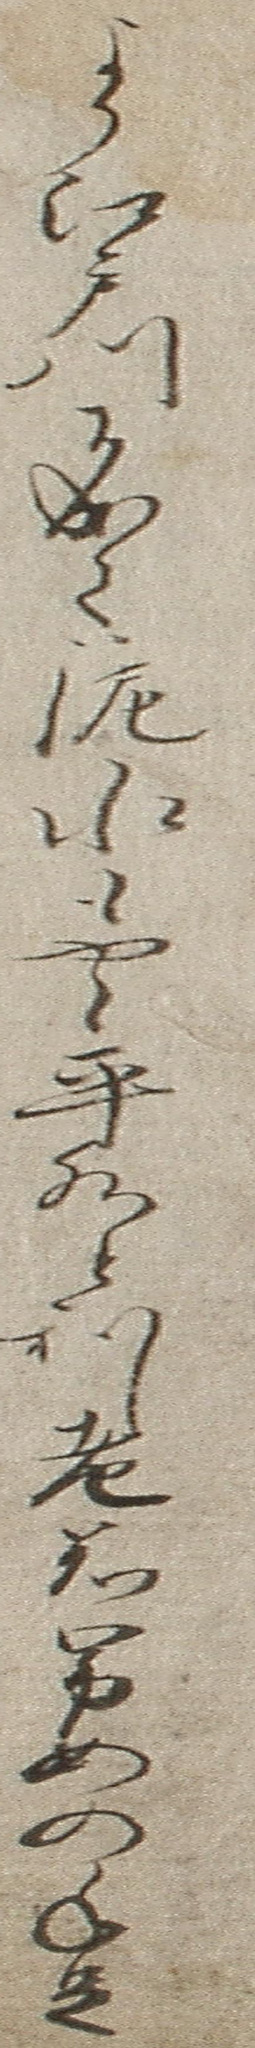より江戸川に成ては泥水もやゝ平水とり老若男女の手足
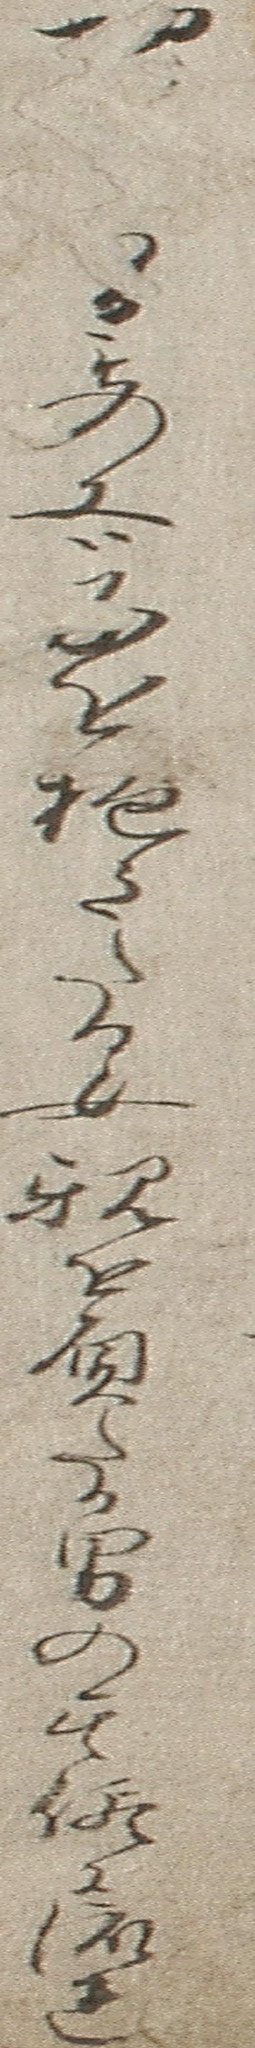切もの又は子を抱たる女親を負たる男の其儘に流れ

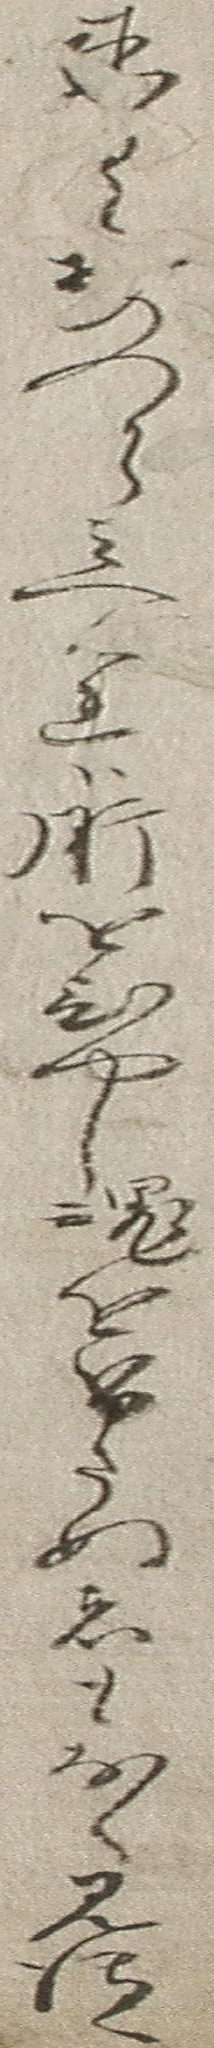来ておのつからみへけれは肝をひやし魂をけさぬ者もなく見伝へ
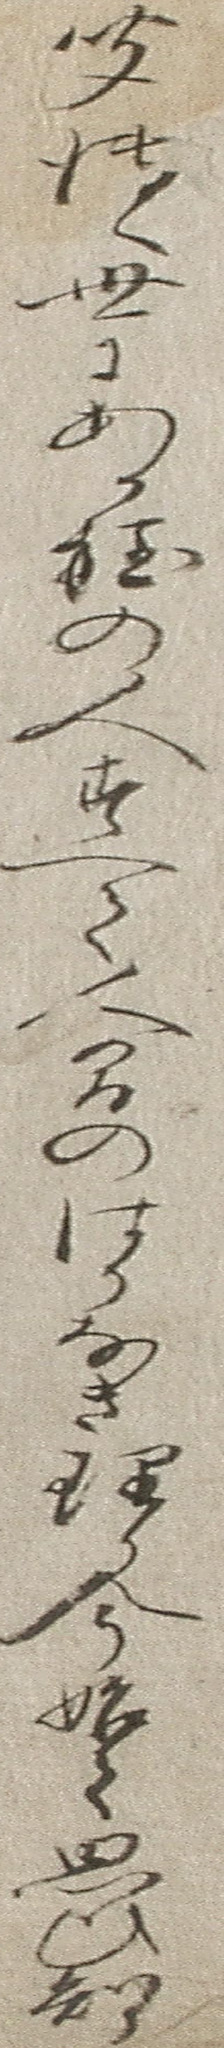聞伝へ世にある程の人すへて人間のはかなき理り今始て思ひ知り
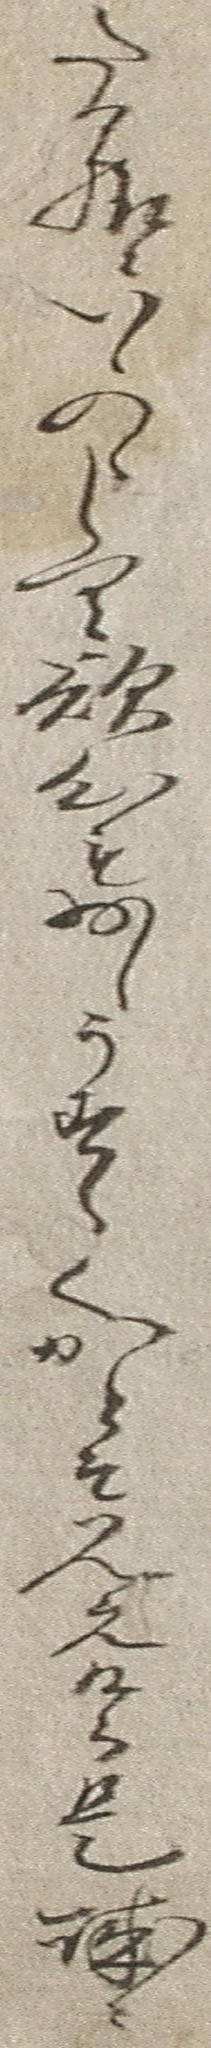たる様にいゝのゝしり欲心も少しうすくかとそ見えける是誠に
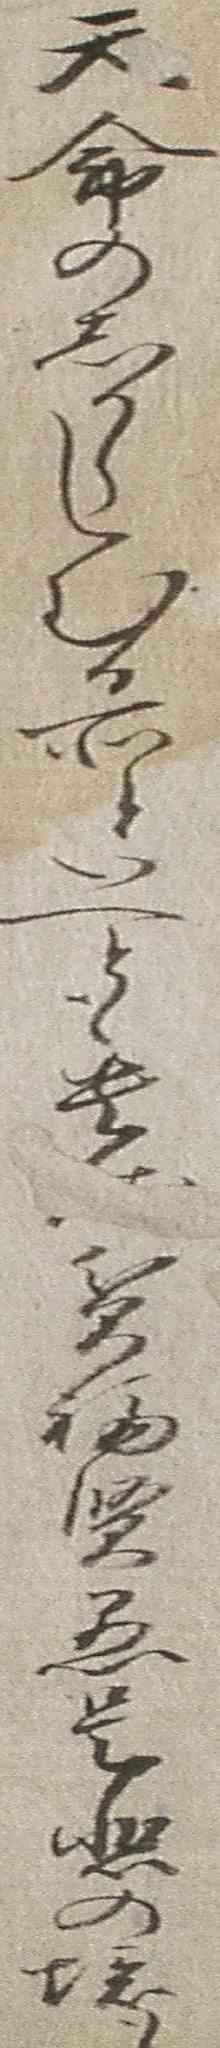天命のしからしむる所といへとも貴質福賢懸是悲の境も
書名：太平秘録抜書　浅間山燒及普賢山崩
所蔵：東京大学地震研究所図書室 Earthquake Research Institute Library, The University of Tokyo, JAPAN
